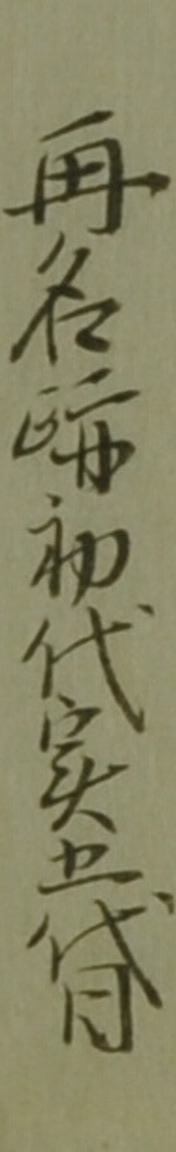再名跡初代実五代目
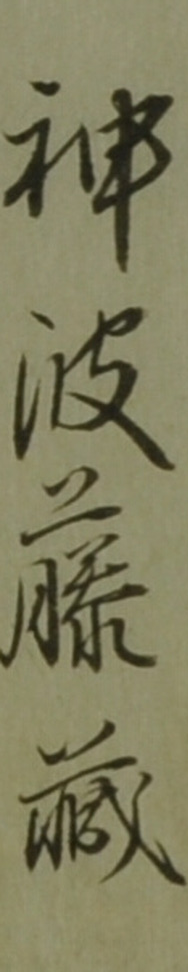神波藤蔵
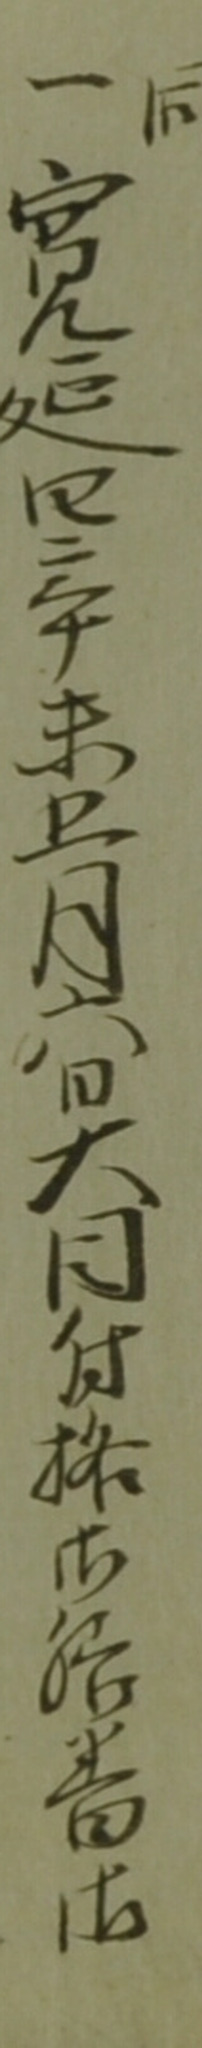一寛延四辛未五月六日大目付格御膳番御
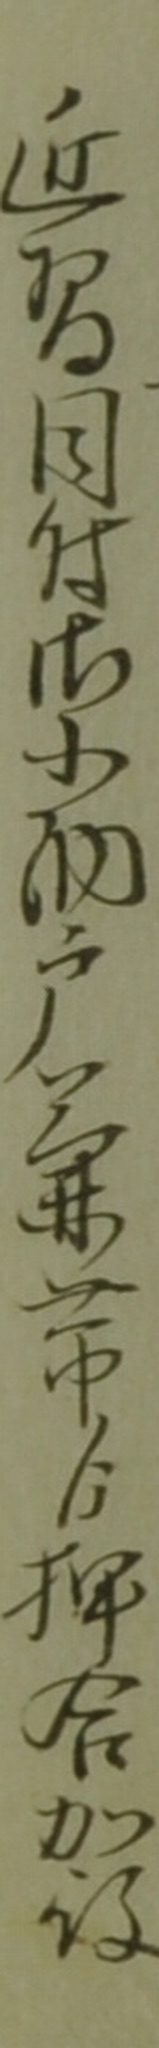近習目付御小納戸兼帯ゟ押合加役
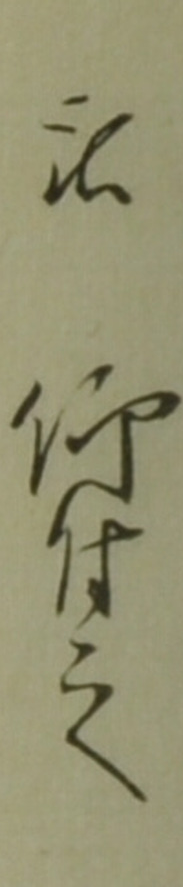被仰付之
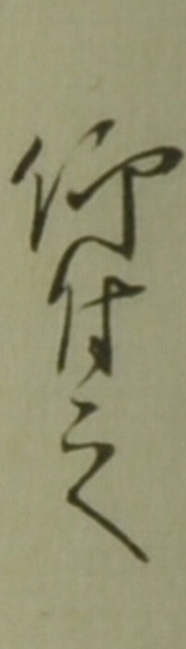仰付之

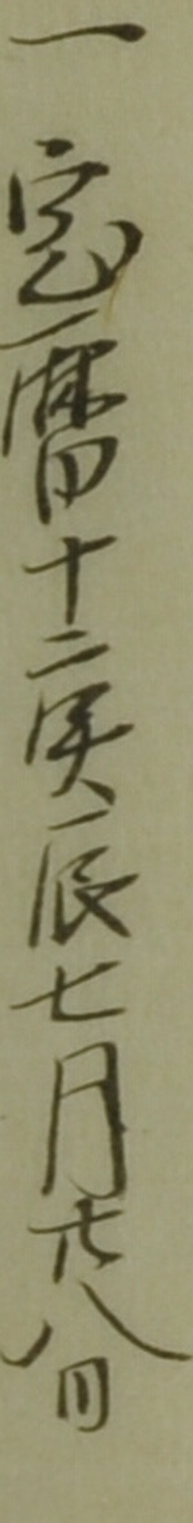一宝暦十庚辰七月廿八日
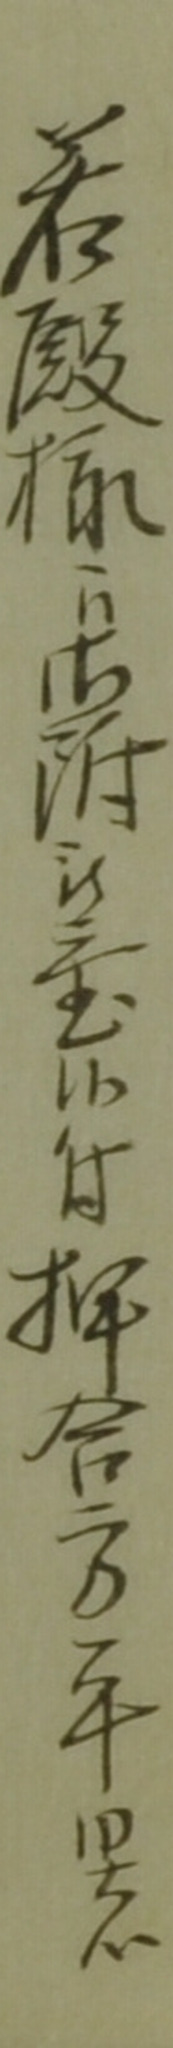若殿様江御附被置候付押合方平日者
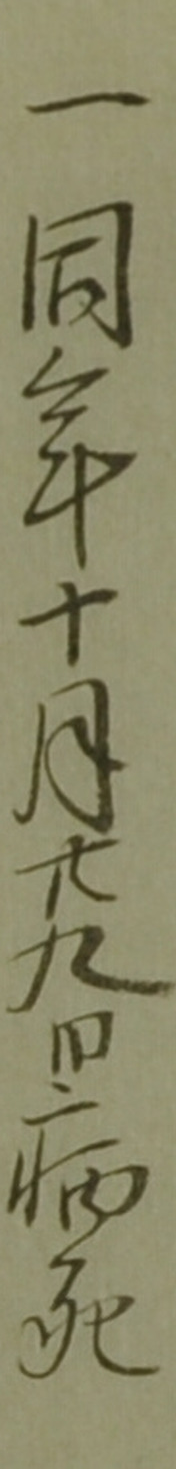一同年十月廿九日病死
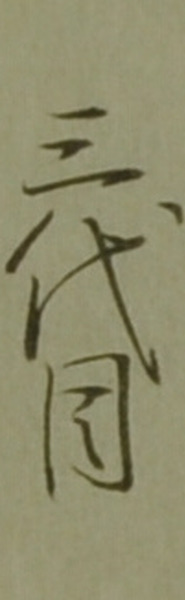三代目
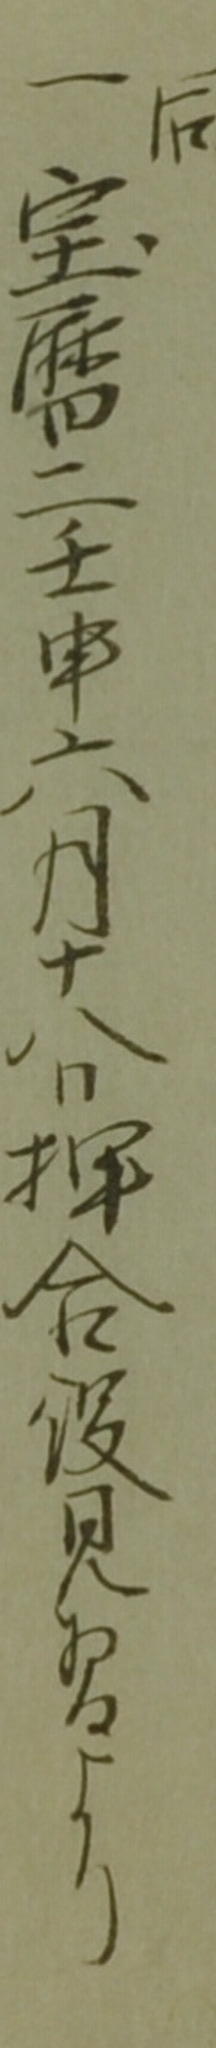一宝暦二壬申六月十八日押合役見習より
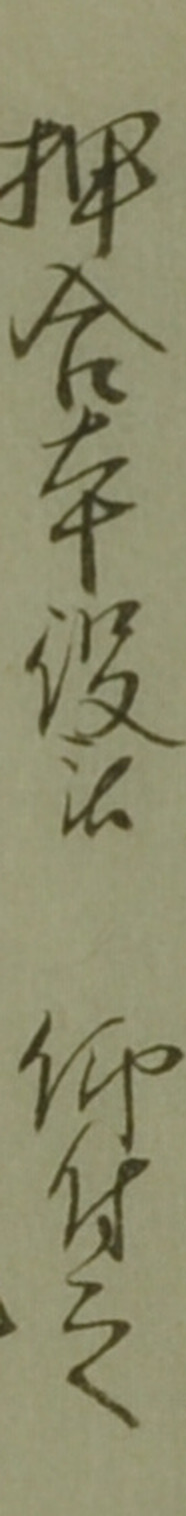押合本役被仰付之
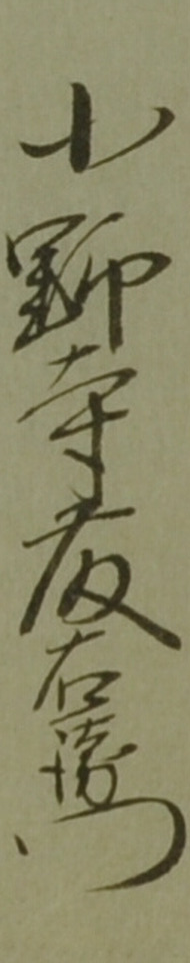小野寺籐右衛門
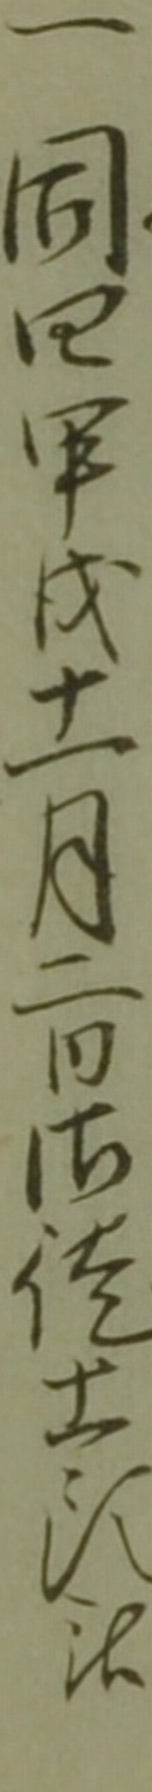一同四甲戌十一月二日御徒士頭被
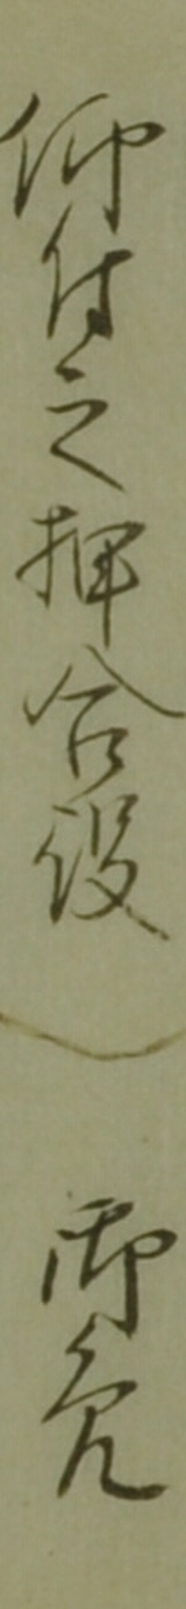仰付之押合役御免
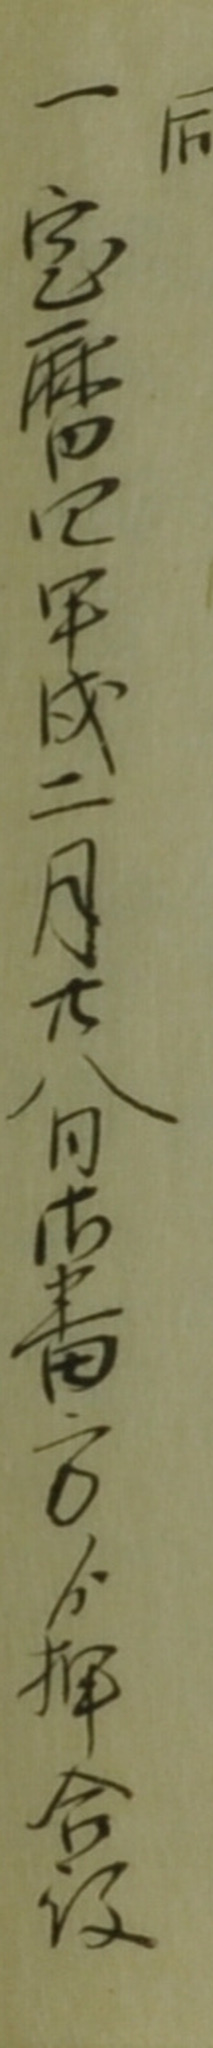一宝暦四甲戌二月廿八日御番方ゟ押合役
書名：諸御役代々録（七）
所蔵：伊那市立高遠町図書館・合同会社AMANE
